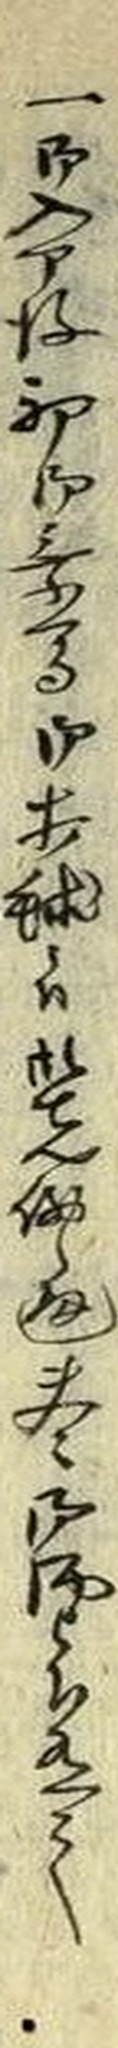一御入部後初御乗馬御打毬ニ付御先例之通夫々御酒被下有之
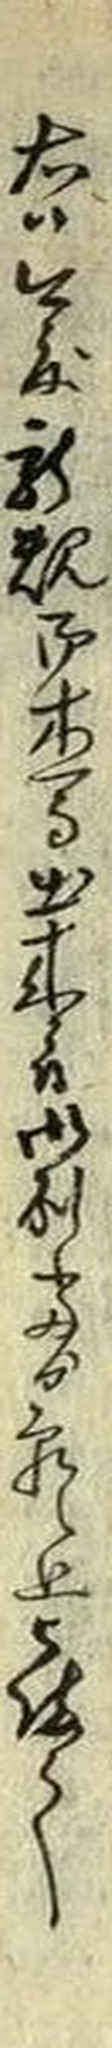右ハ今度新規御木馬出来候ニ付御別当ゟ願之上被備之
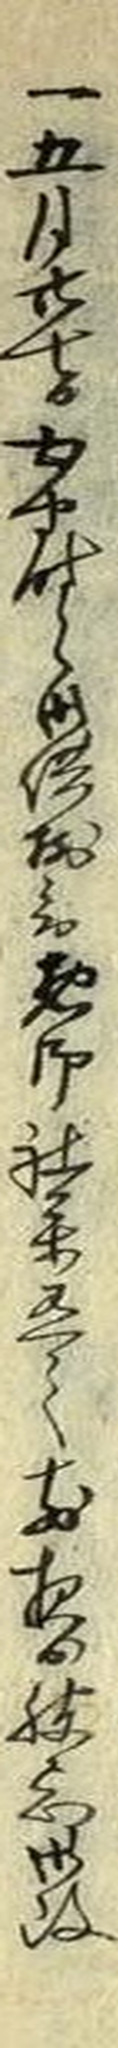一五月廿七日五半時之御供揃ニ而惣御社参有之前夜ゟ服忌御改
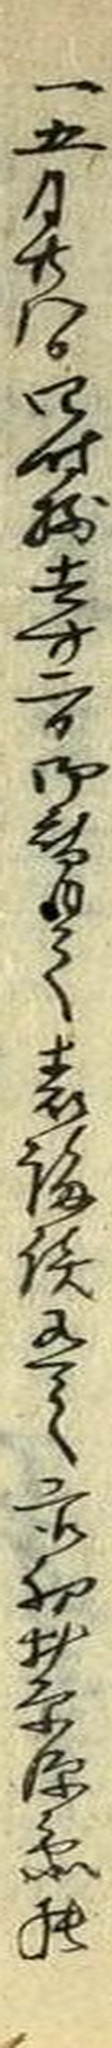一五月廿八日四時揃去廿二日御替日之表講談有之最初井原源兵衛罷
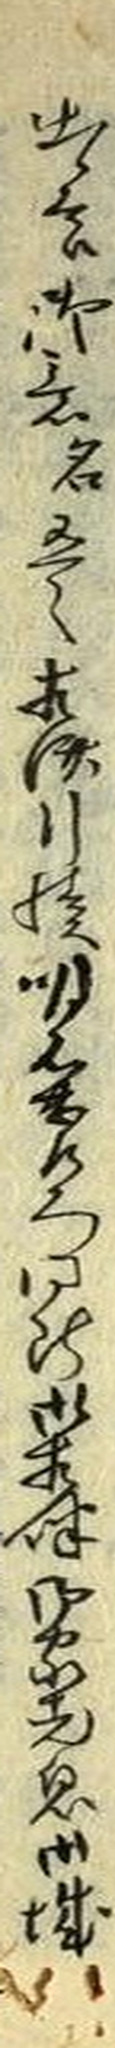出候節御意名有之相済引続明石甚左衛門同断御相伴御家老息御城
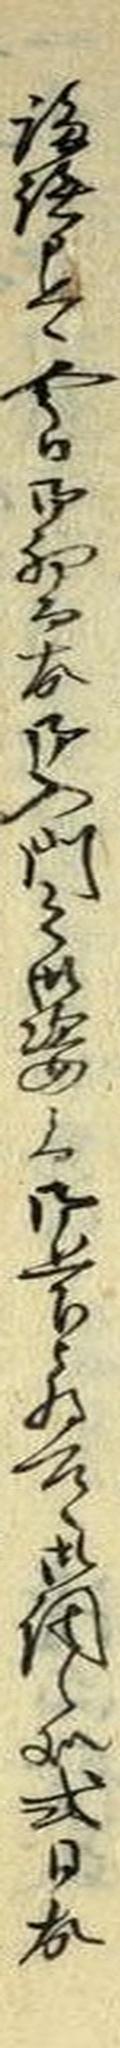講談申上候今日御初而故御入門之御姿ニ而御上下被為召御調候処式日故
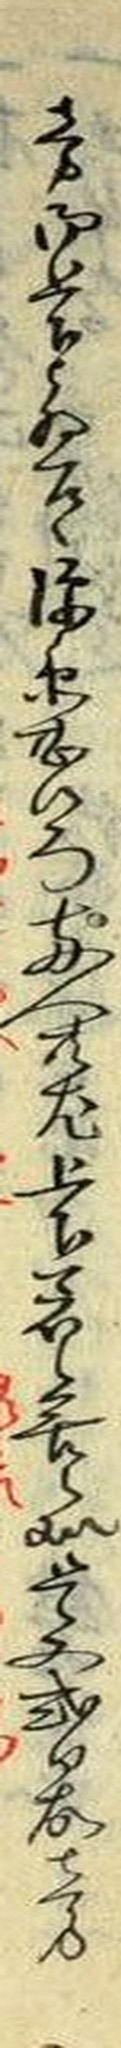旁御上下被為召候源兵衛甚左衛門両人共尤上下着候筈之処是又式日故旁
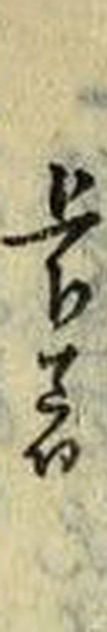上下着
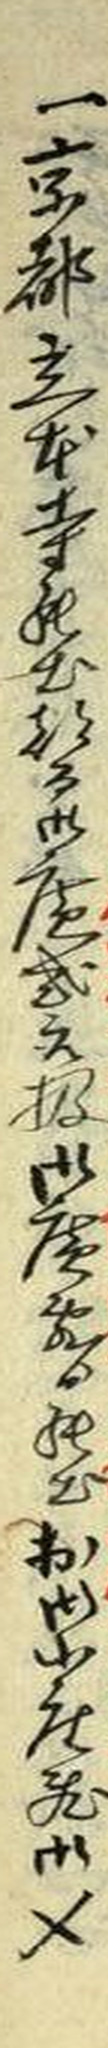一京都立本寺罷出都而御広式取扱御広敷ゟ罷出於御小座敷御〆
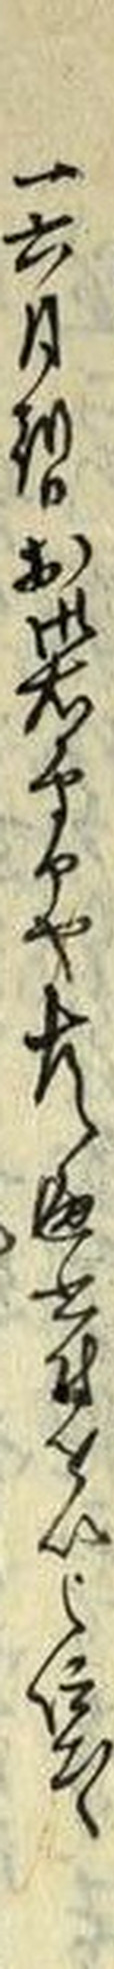一六月朔日於御右筆部や左之通書付を以被仰出候
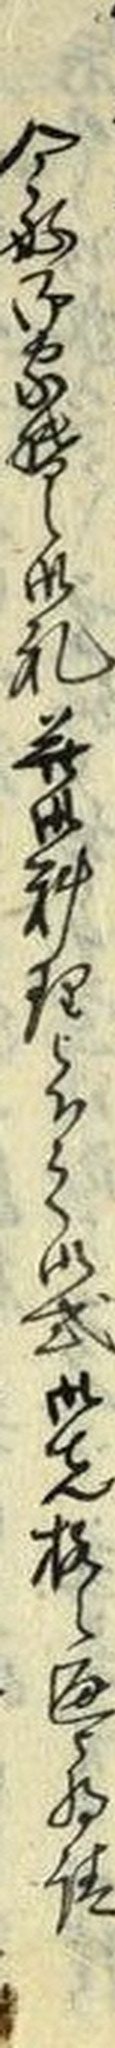今般御家督之御礼并御料理被下之御式御先格之通被為請
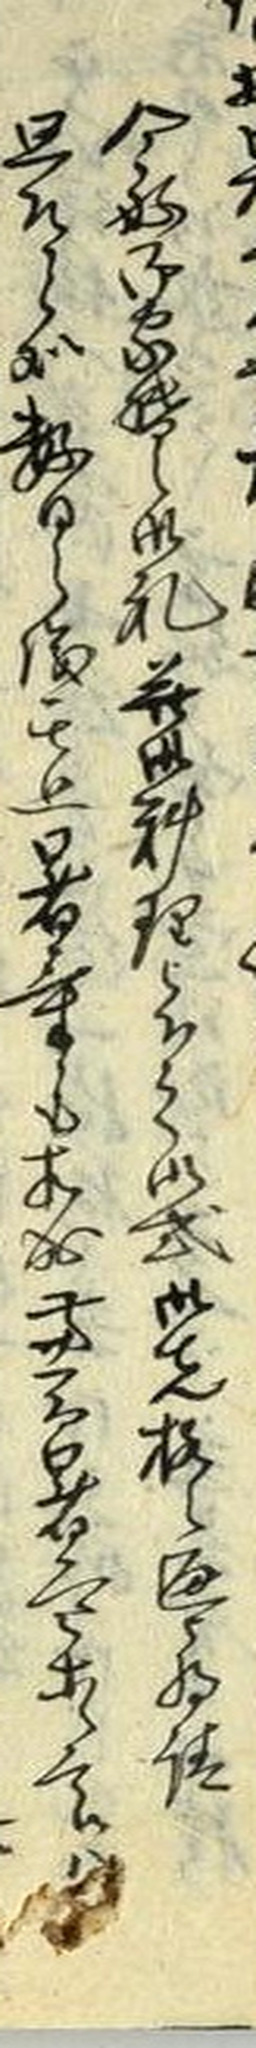思召之処数日之儀其上暑気ニも相成兼而暑寒等之節ハ
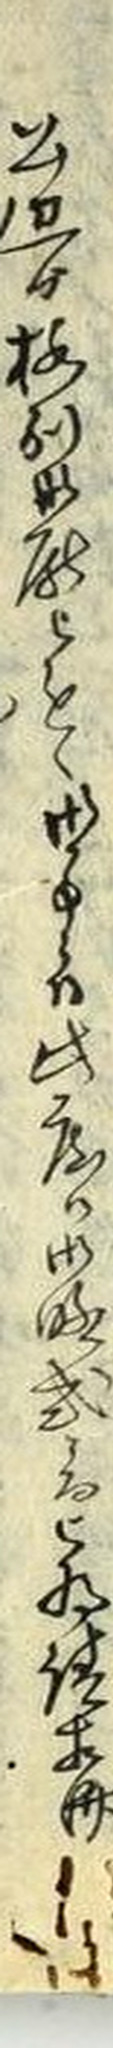公辺ゟ格別御厭被進候御事ニ付此度ハ御略式ニ而被為請相済
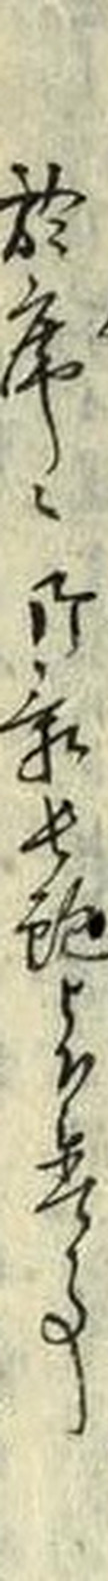於席々御影長鮑被下置候事
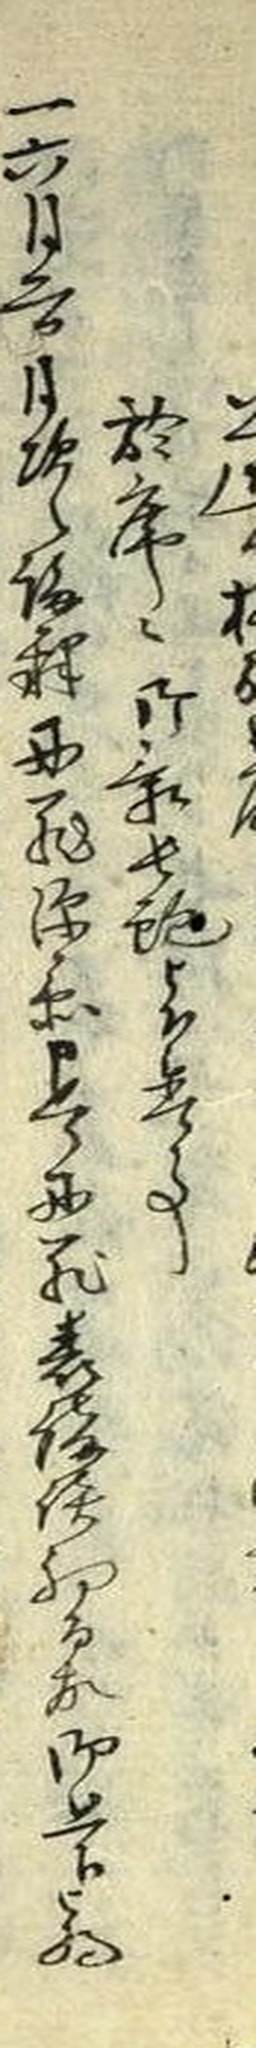一六月二日月次之講釈丹蔵源兵衛申上候丹蔵表講談初而故御上下被為
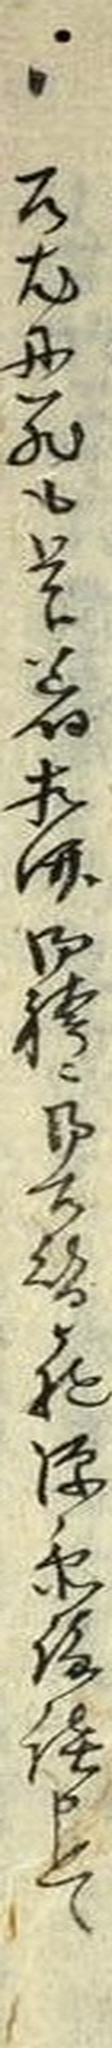召尤丹蔵も上下着相済御袴ニ御召替被遊源兵衛講談申上候
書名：少傅日録抄（斉善付側向頭取日記、江戸并道中、初入在国、逝去後…
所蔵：福井県文書館 Fukui Prefectural Archives
